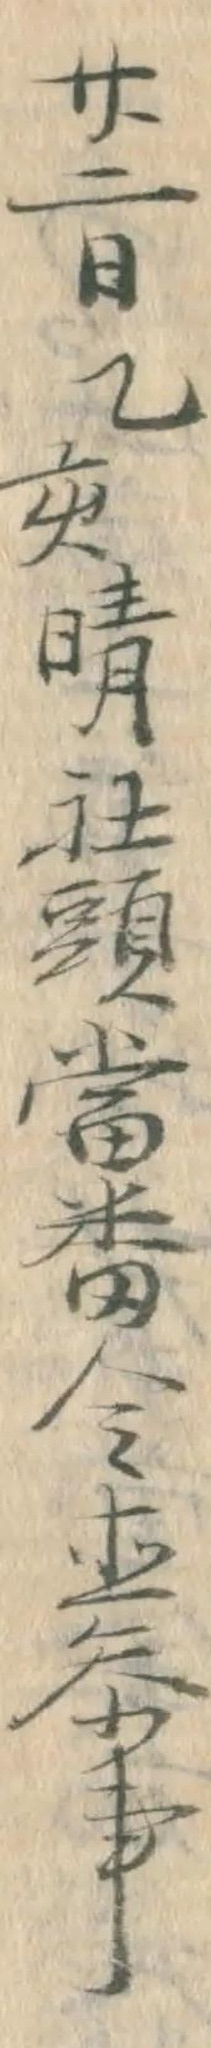廿二日乙亥晴社頭當番令直参事

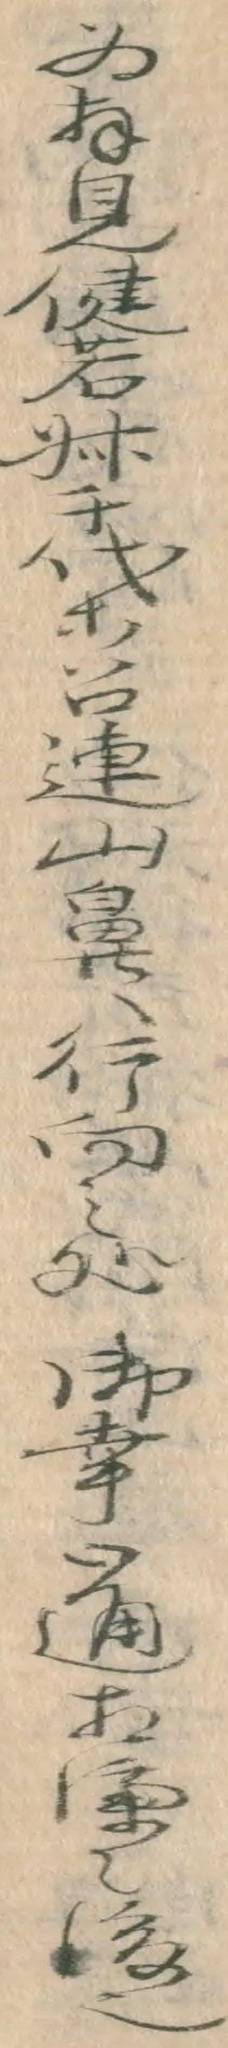為拝見健若済千代等召連山鼻へ行向之処御幸御通相済之後也
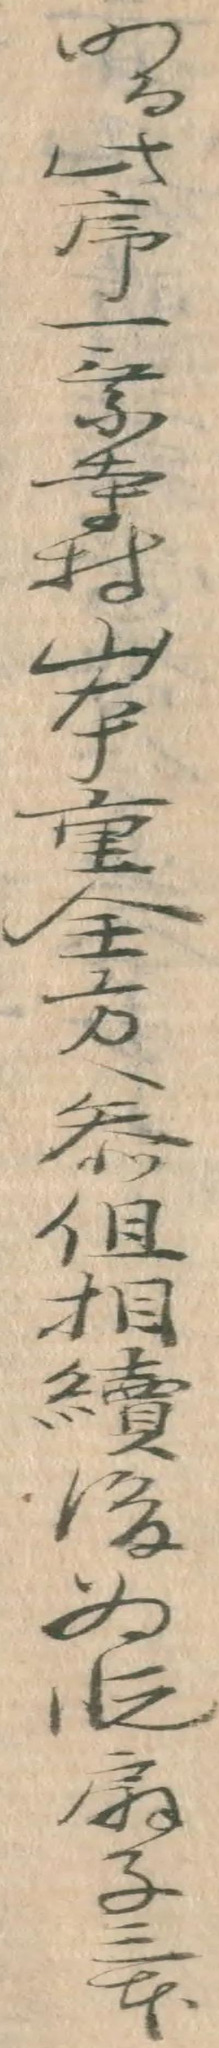仍而此序一乗寺村山本重全方へ参但相続後為祝扇子三本
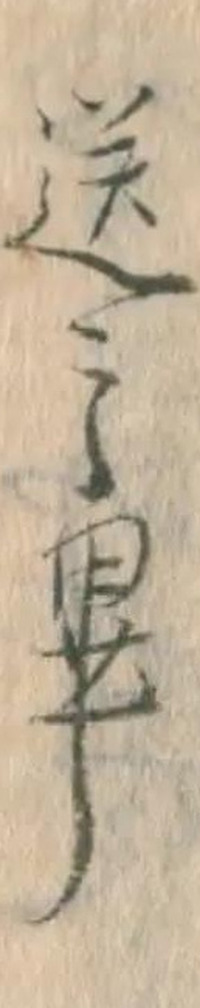送之事
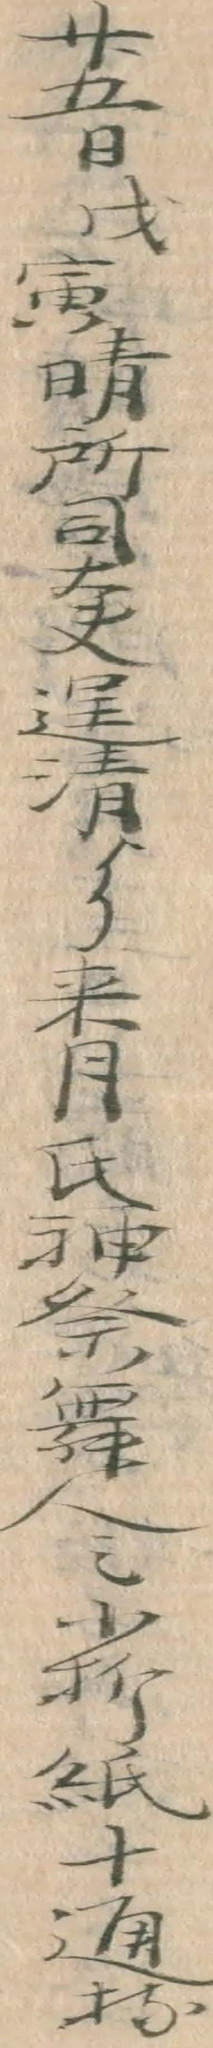廿五日戊寅晴所司大夫逞清より来月氏神祭舞人之小折紙十通持
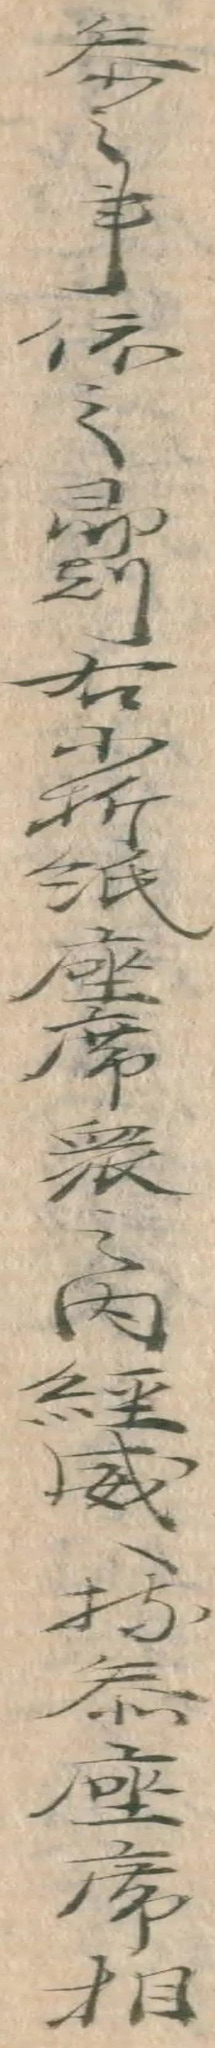参之事依之即刻右小折紙座席衆之内経威へ持参座席相
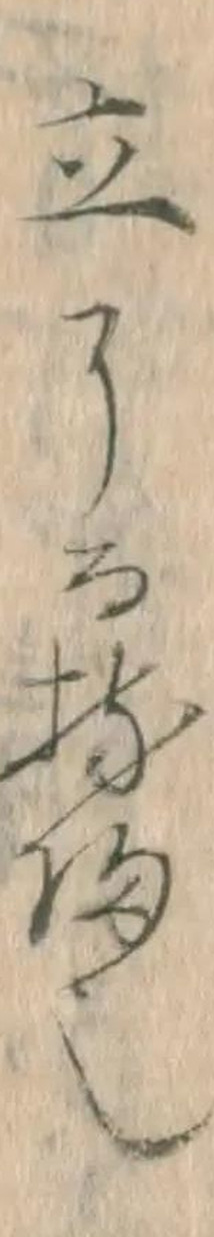立了而持帰也
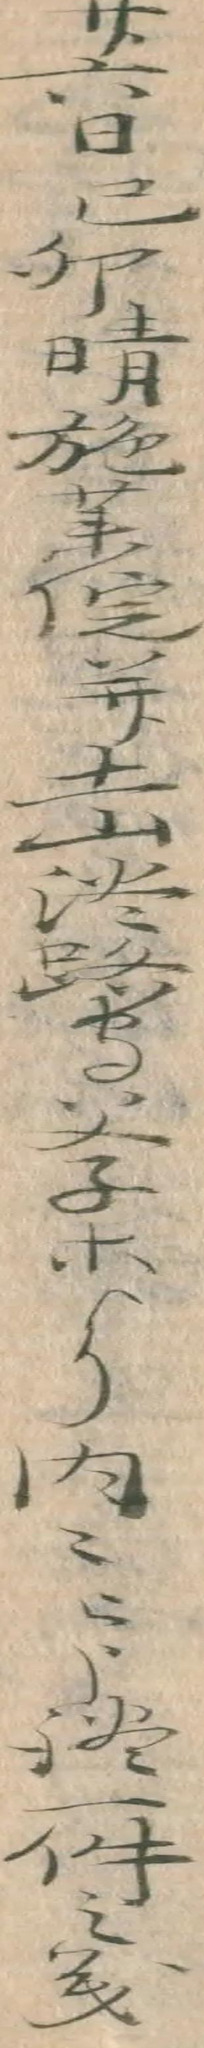廿六日己卯晴施薬院并土山淡路守父子等より内々被申談一件之義
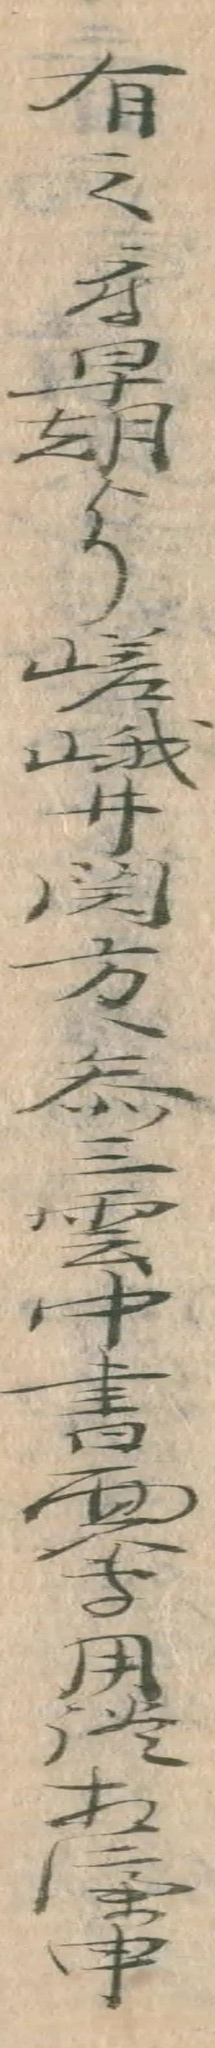有之ニ付早朝より嵯峨井関方へ参三雲中書面會用談相済申
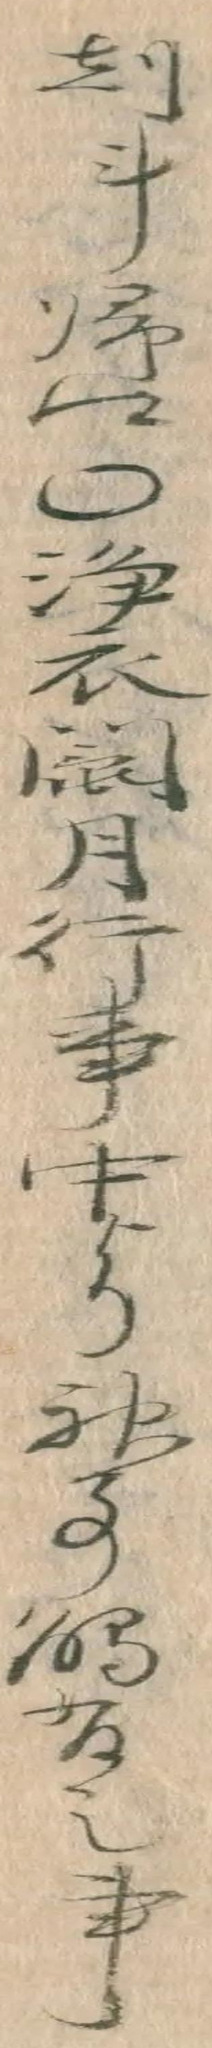刻斗帰郷〇浄衣鬮月行事中より神事触有之事
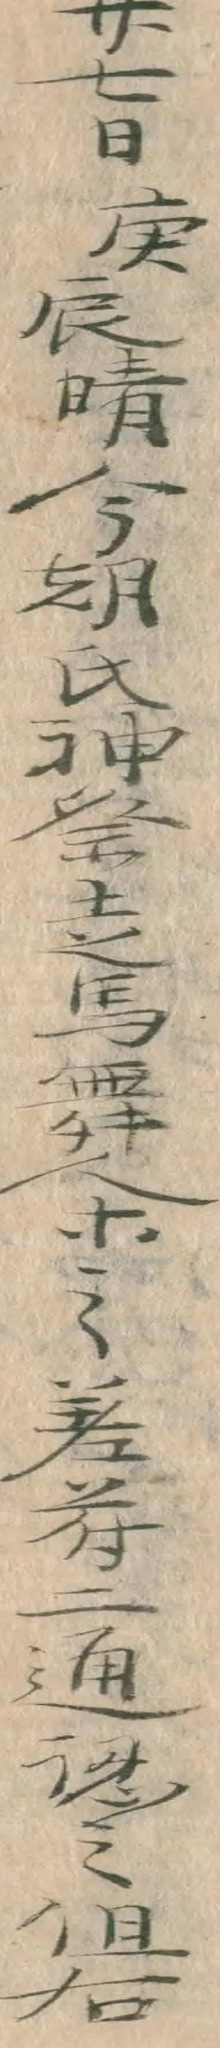廿七日庚辰晴今朝氏神祭走馬舞人等之差符二通認之但右
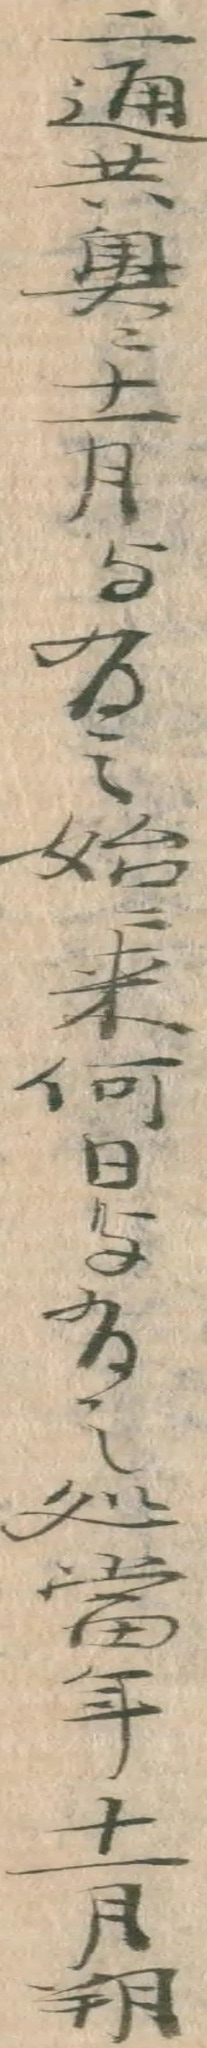ニ通共奥ニ十一月と有之始ニ来何日と有之処當年十一月朔
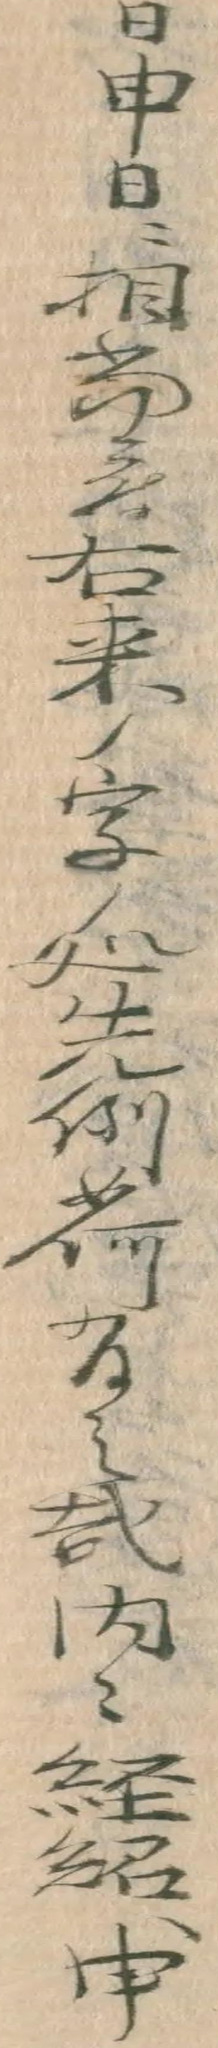日申日ニ相番ニ付右来ノ字ノ処先例如何有之哉内々経招へ申
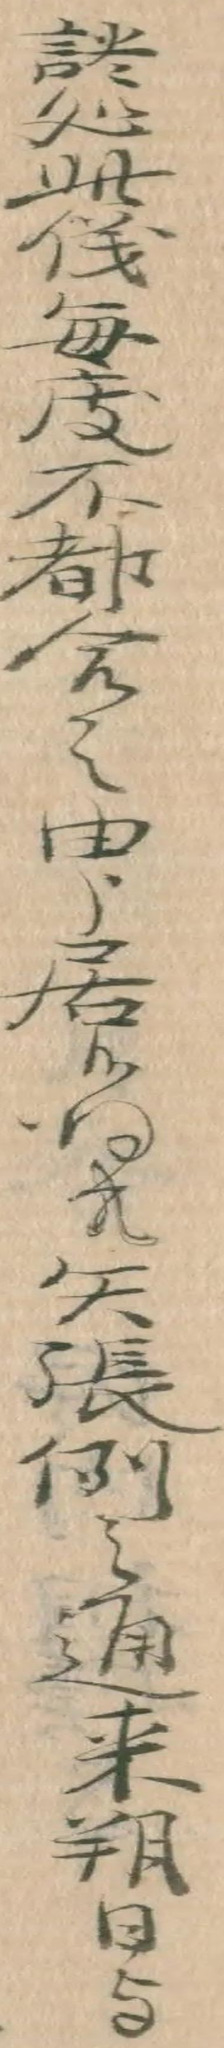談処此儀毎度不都合之由申居候得共矢張例之通来朔日と
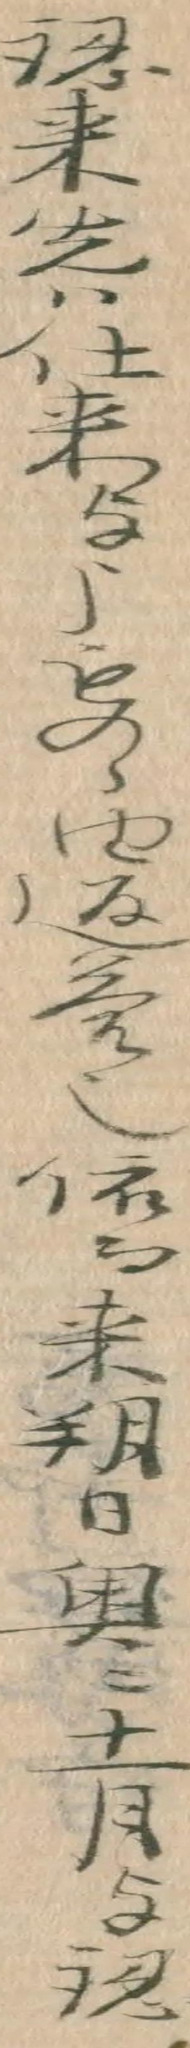認来先ハ仕来と申ものゝ由返答也依而来朔日奥に十一月と認
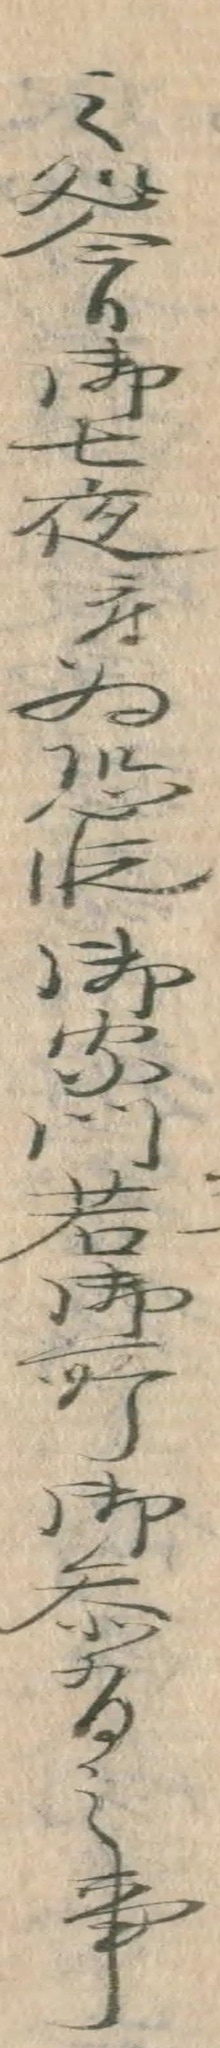之処今日御七夜ニ付為恐悦御家門若御所御参有之事
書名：賀茂社記録. 第65冊
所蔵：国立国会図書館 National Diet Library, JAPAN
